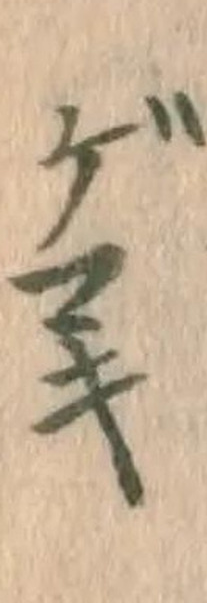ゲマキ
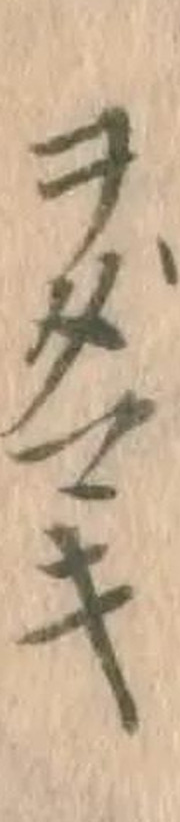ヲダマキ
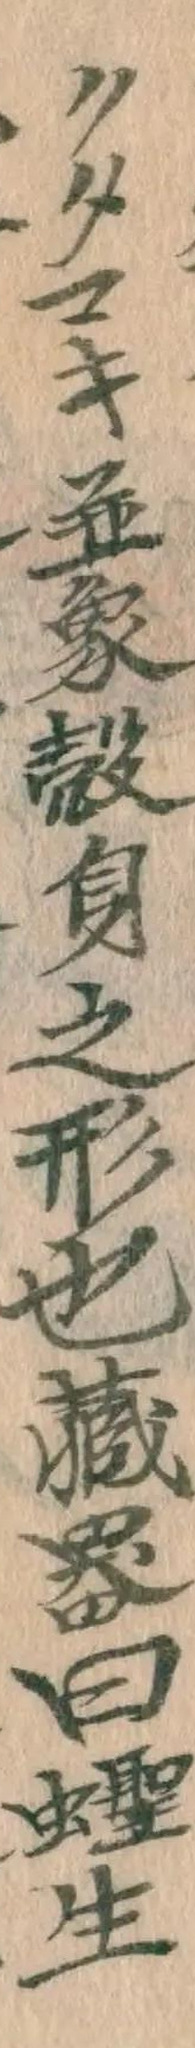クタマキ並象殻身之形也藏器曰蟶生
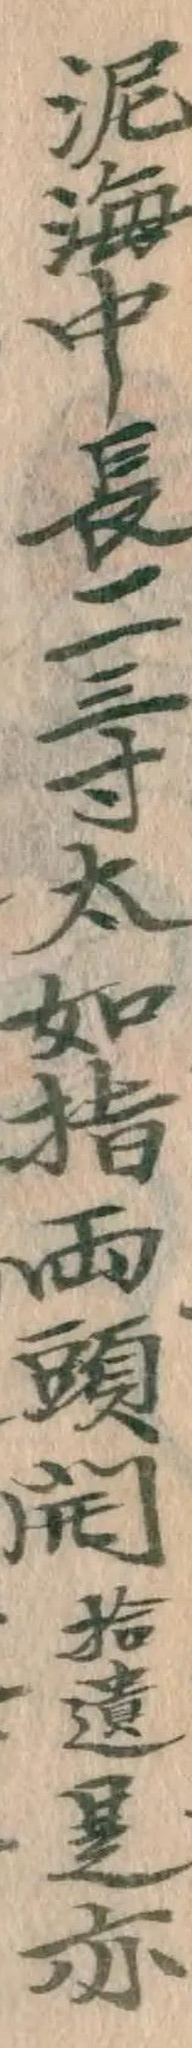泥海中長二三寸太如指両頭開拾遺是亦
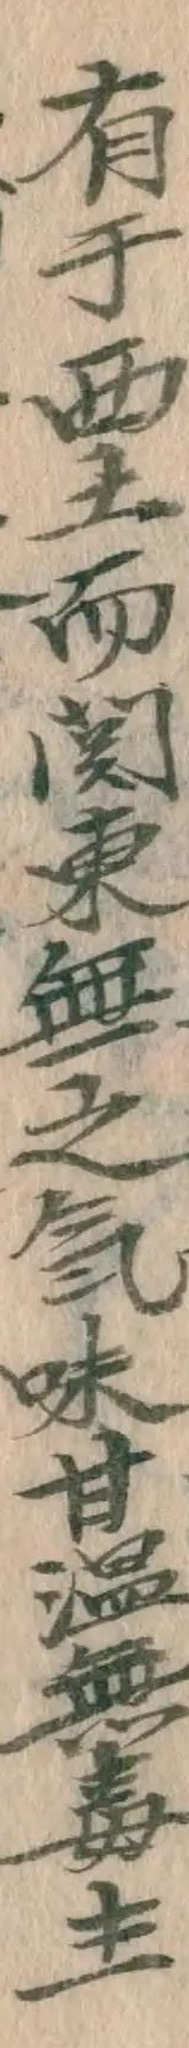有于西土而関東無之気味甘温無毒主
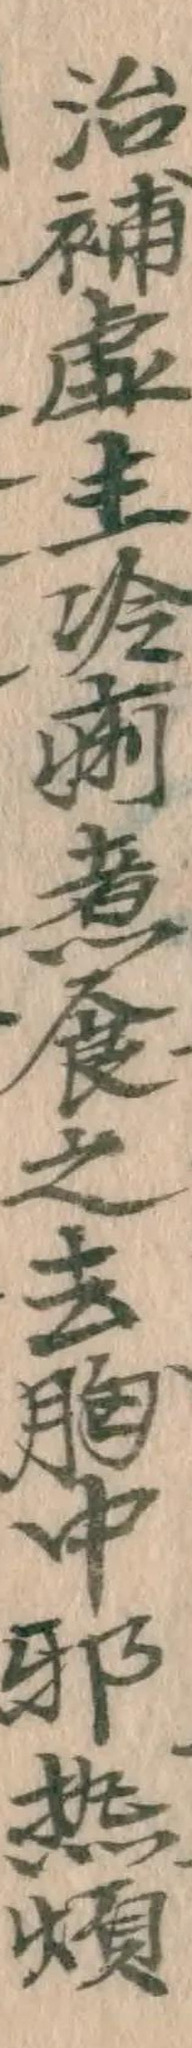治補虚主冷痢煮食之去胸中邪熱煩
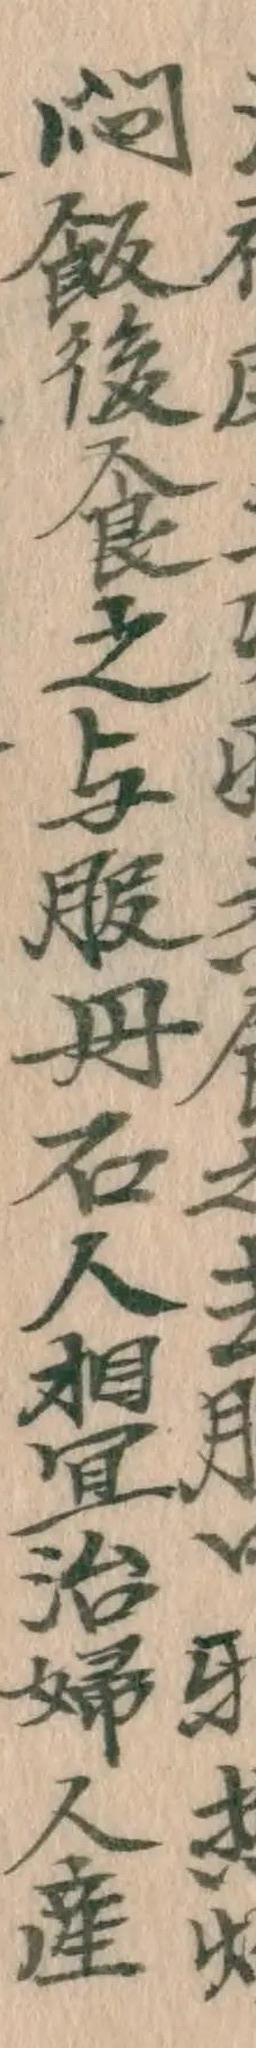悶飯後食之与服丹石人相冝治婦人産
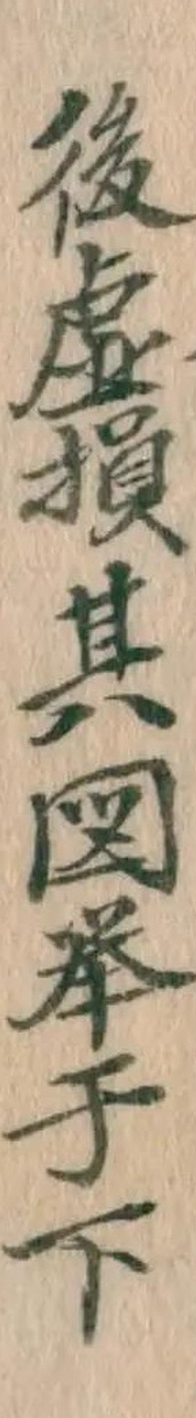後虚損其図挙于下
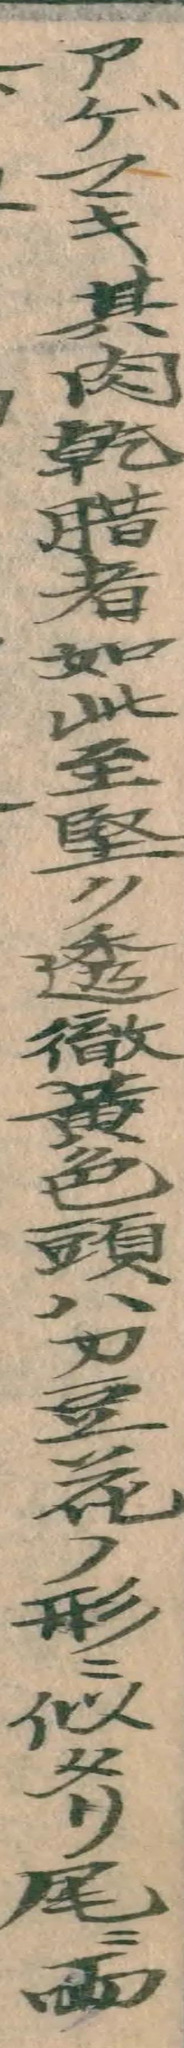アゲマキ其肉乾腊者如此至堅ク透徹黄色頭ハ刀豆花ノ形ニ似タリ尾ニ両
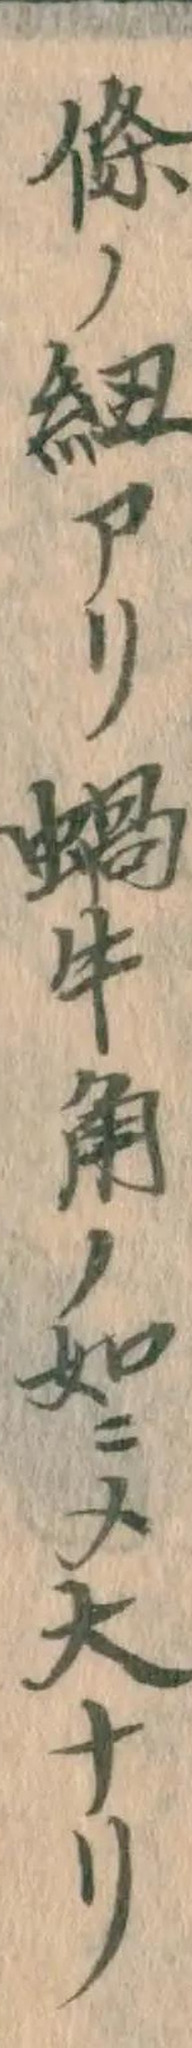條ノ紐アリ蝸牛角ノ如ニシテ大ナリ
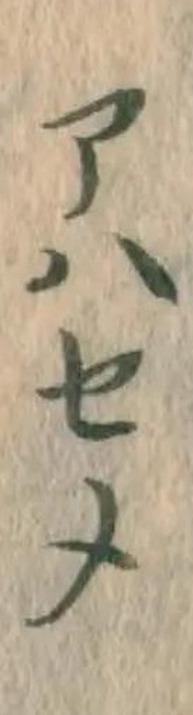アハセメ
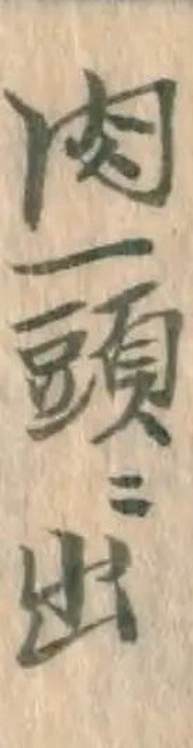肉一頭ニ出
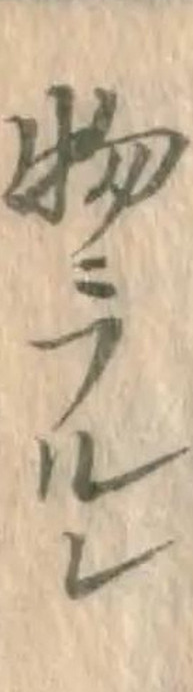物ニフルレ
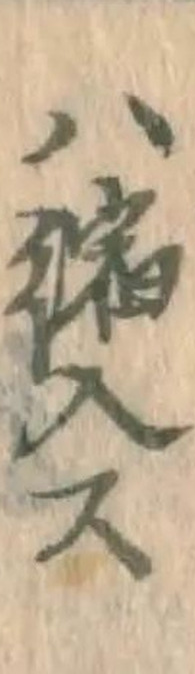ハ縮入ス
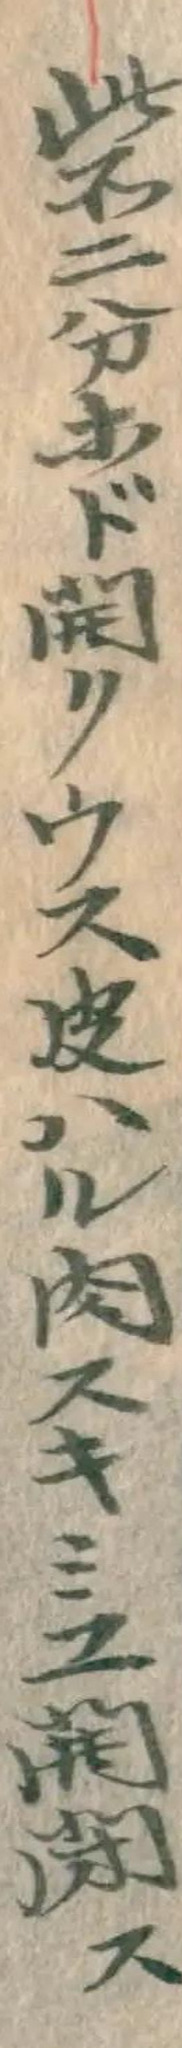└此所二分ホド開クウス皮ハル肉スキミユ開閉ス
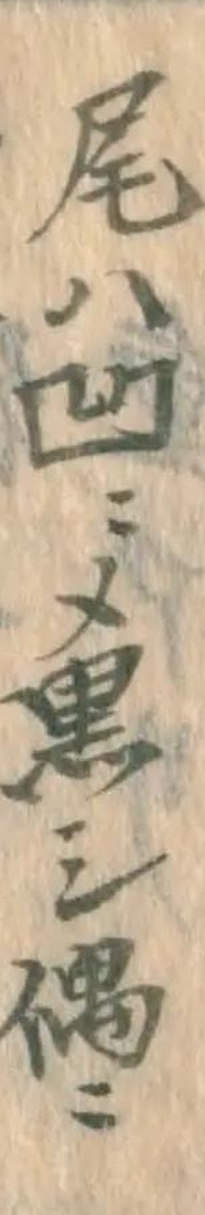尾ハ凹ニシテ黒シ偶ニ
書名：千蟲譜 3巻. [3]
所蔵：国立国会図書館 National Diet Library, JAPAN
